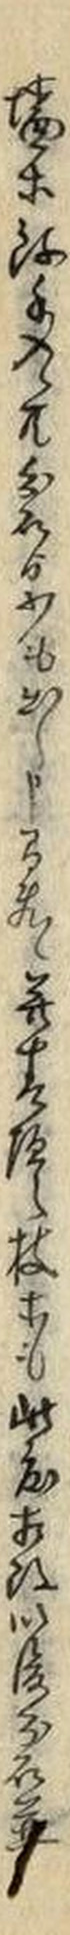墻等致手入候共分石ゟ少も出し申間敷候并青垣之枝等も此度相改以後分石並
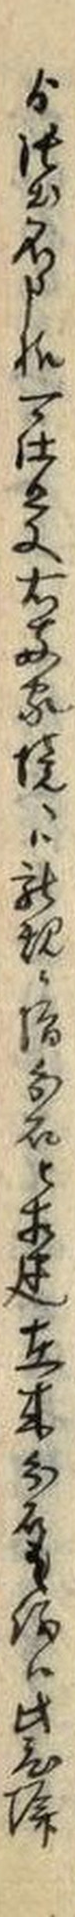ゟ張出不申様可仕且又右両家境へは新規に増分石被相建在来分石之儀は此度塀
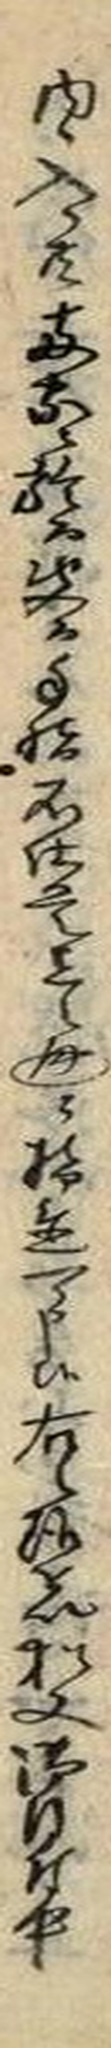内へ入候共両家に於て決て手指不仕是迄之通に指置可申候右之趣を以猶又御目付中

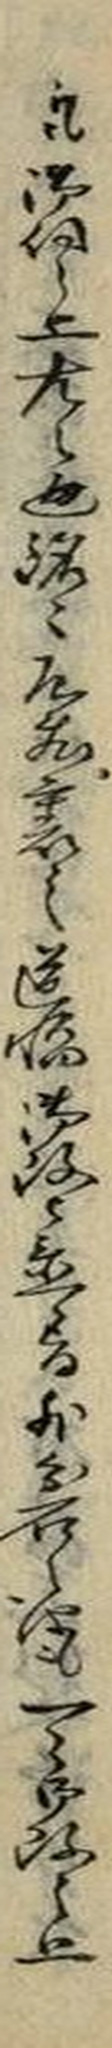えも御伺之上左之通銘々屋敷裏之道幅御改被置候旨外分石之儀も一々御改之上
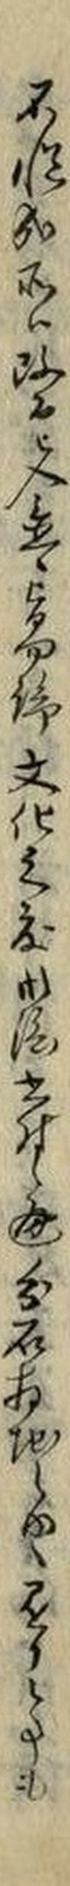不慥成所は改て被入置候旨勿論文化之度御渡書付之通分石拝地之内へ懸り候事も
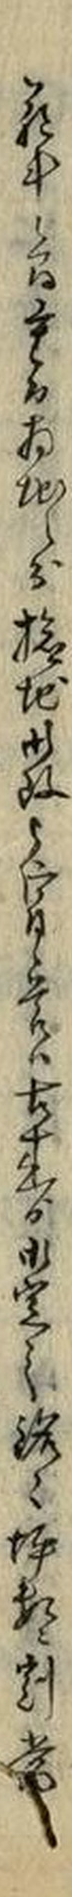難斗候間重て拝地之分検地御改被仰付候節は古来ゟ御定之銘々坪数に割当
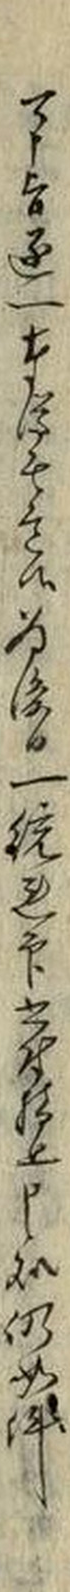可申旨逐一奉得其意候為後日一統連印書付指上申処仍如件
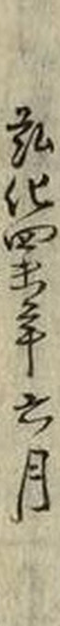弘化四未年六月
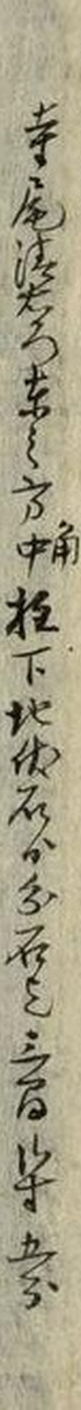寺尾清右衛門東之方中柱下地伏石ゟ分石迄三間弐寸五分
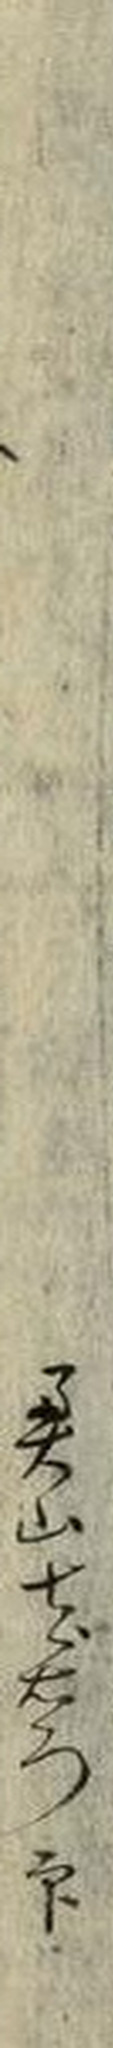奧山七郎右衛門印
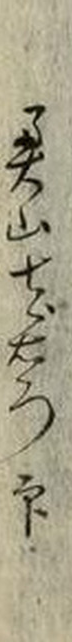奧山七郎右衛門印
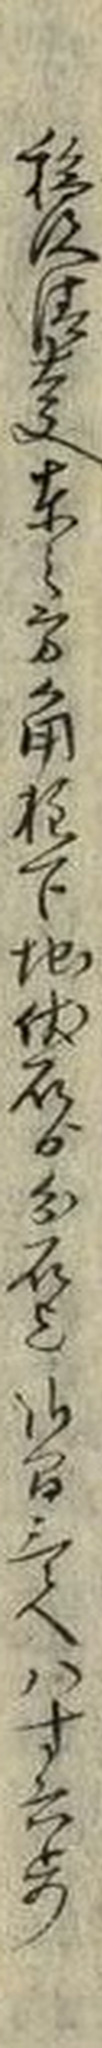稲沢清大夫東之方角柱下地伏石ゟ分石迄弐間三尺八寸六歩
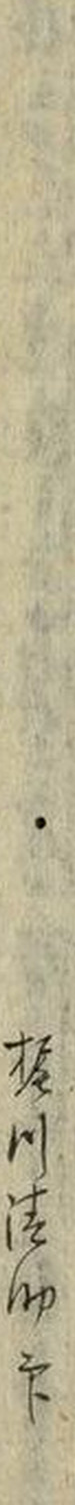梶川清助印
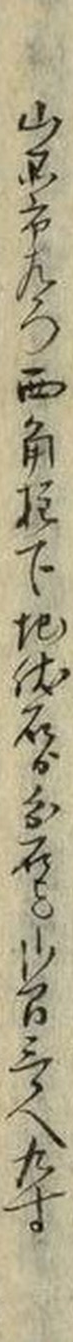山品市左衛門西角柱下地伏石ゟ分石迄弐間三尺九寸
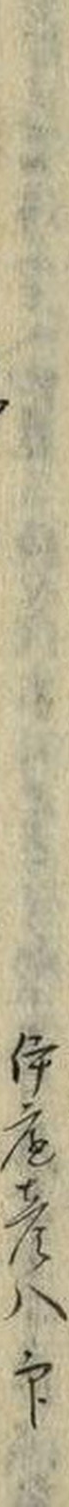伊庭彦八印
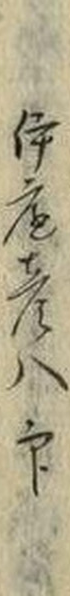伊庭彦八印
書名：御城下諸事之部
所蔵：福井県文書館 Fukui Prefectural Archives
